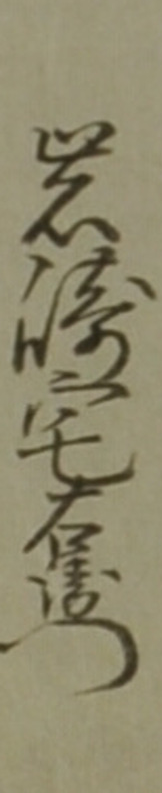岩崎宅右衛門

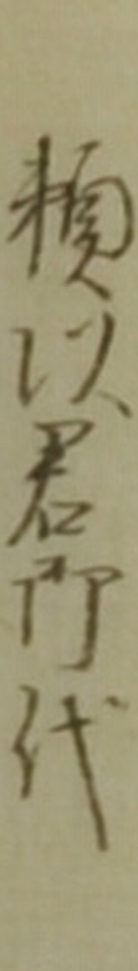頼以君御代

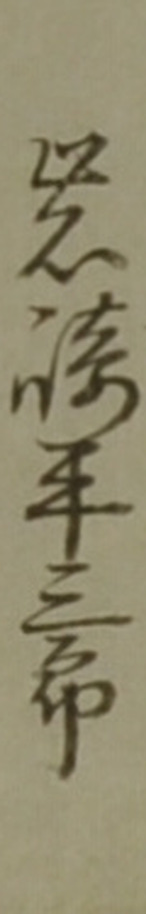岩崎平三郎
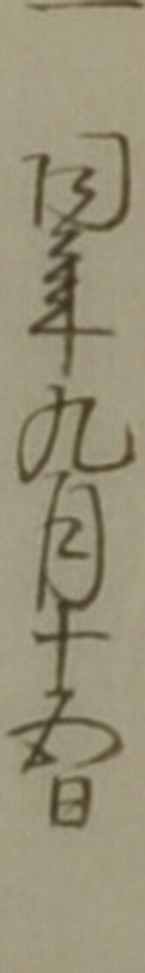一同年九月十五日

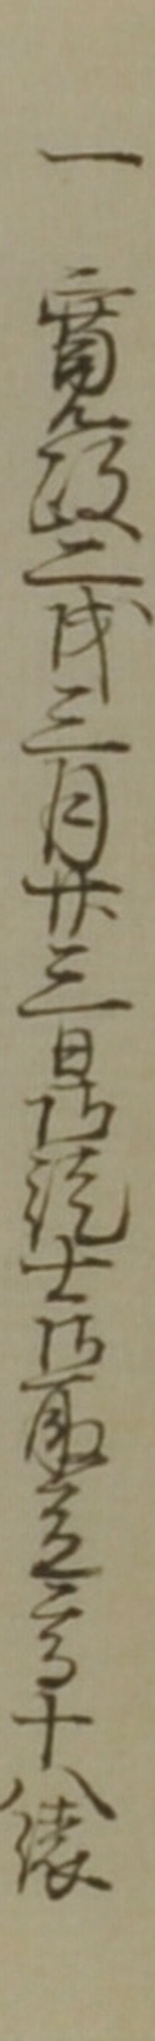一寛政二戌三月廿三日御徒士御取立高十八俵
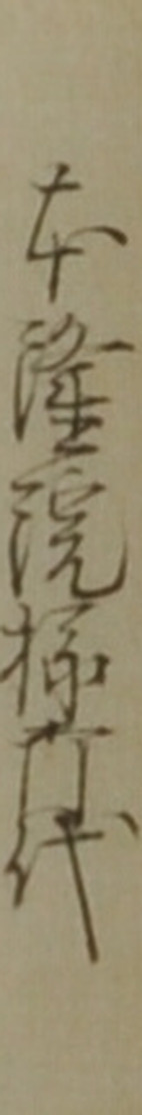本隆院様御代
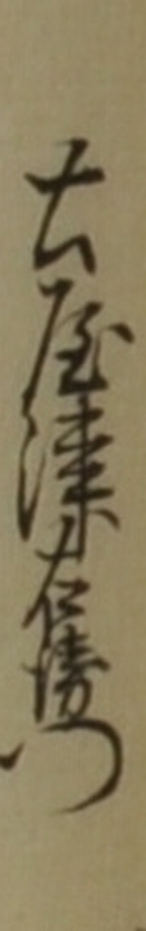土屋津右衛門
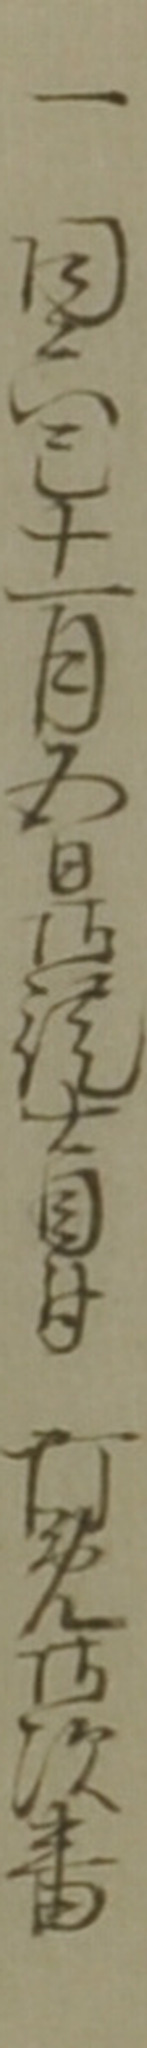一文化三寅九月十五日御徒士目付御免御次番
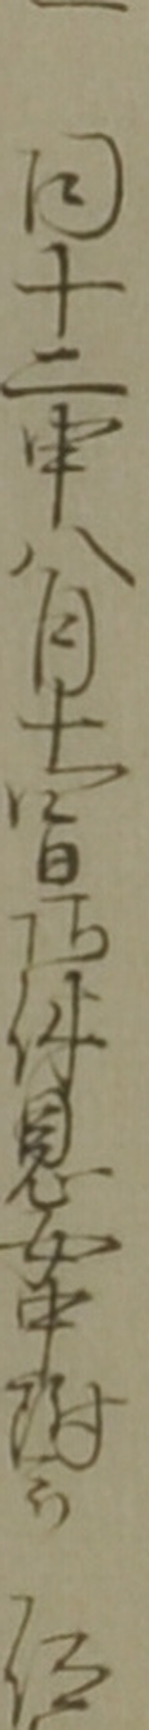一同十二申八月十四日御休息女中附被仰付
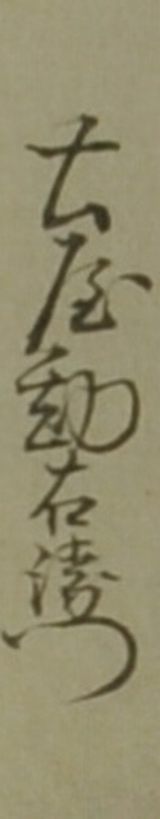土屋勘右衛門

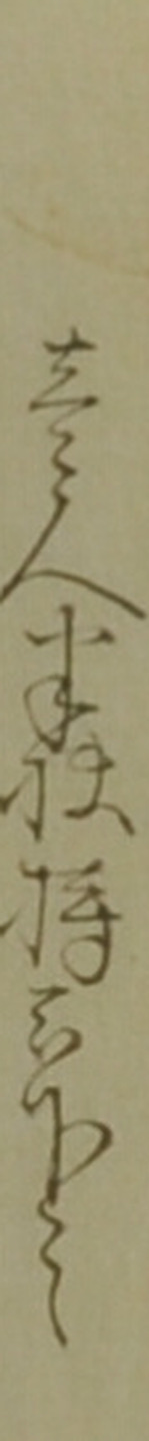壱人半扶持被下之
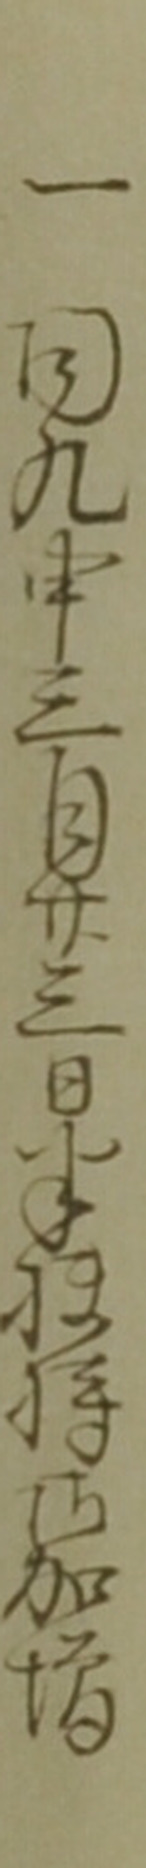一同九申三月廿三日半扶持御加増
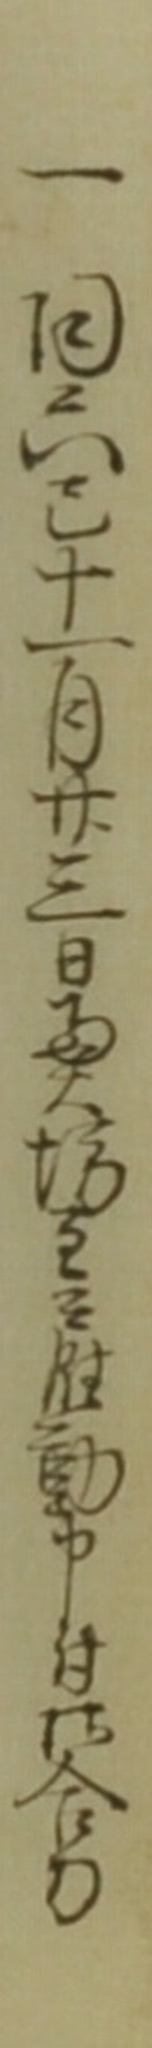一同六巳十一月廿三日奥坊主雇勤申付御合力
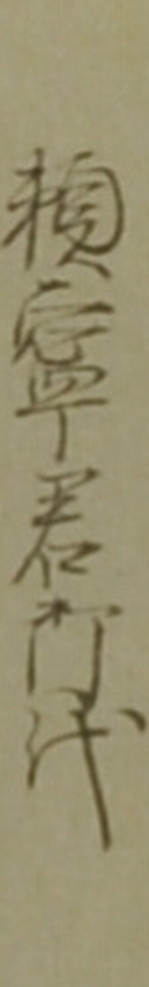頼寧君御代
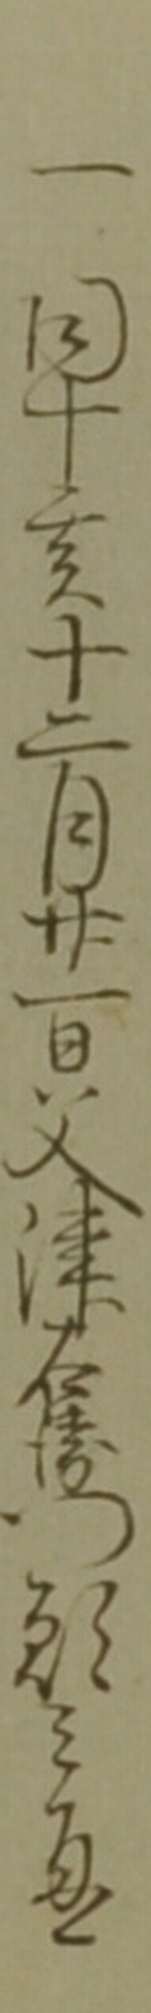一同十亥十二月廿一日父一日津右衛門願之通
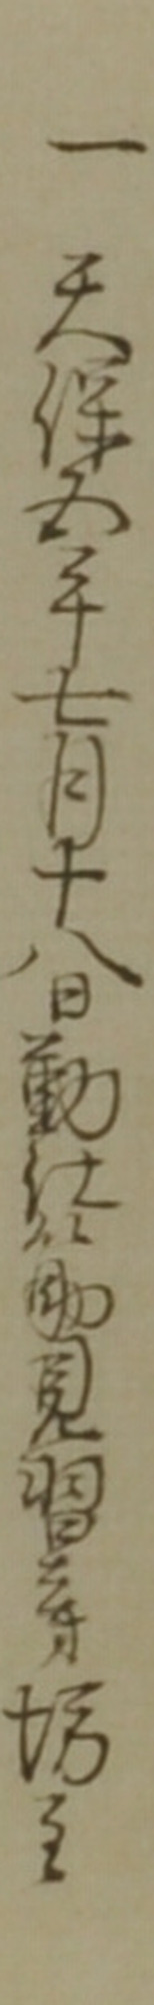一天保五午七月十八日勤仕筋見習旁坊主
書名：無足諸士勤仕録（六）
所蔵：伊那市立高遠町図書館・合同会社AMANE
